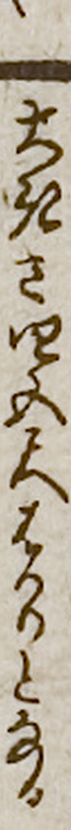大きさ四五尺はかりとなる
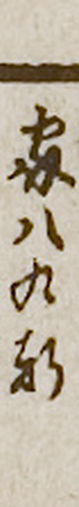家八九軒
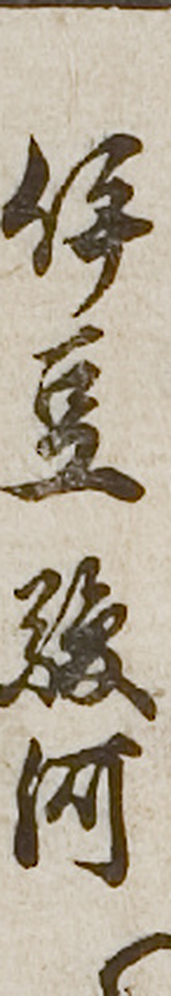伊豆駿河
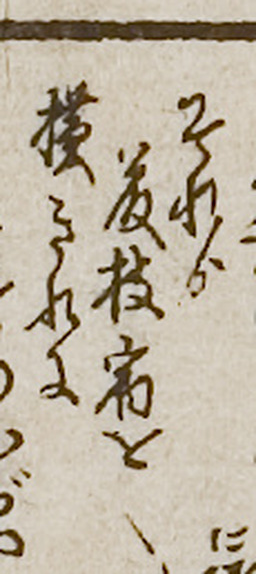藤枝宿を
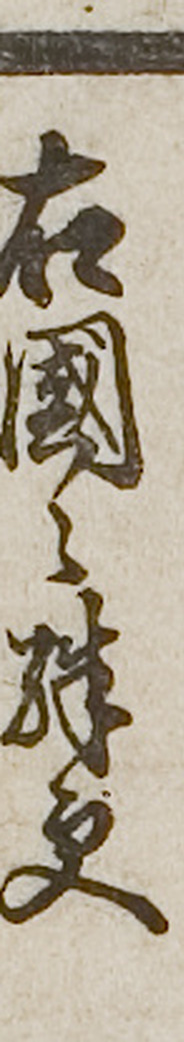右国々殊更
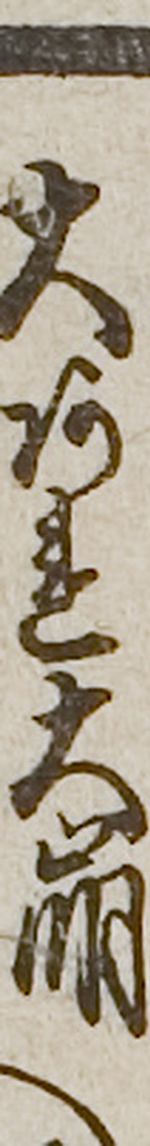大あれ大崩
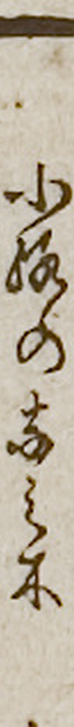小路のなみ木
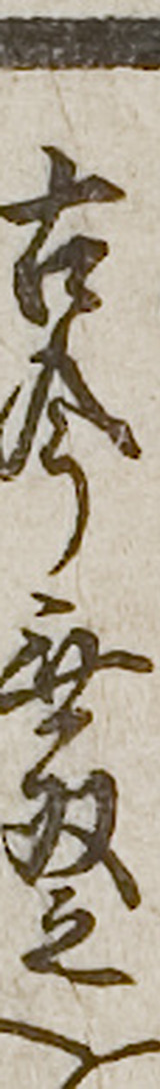古今無双之
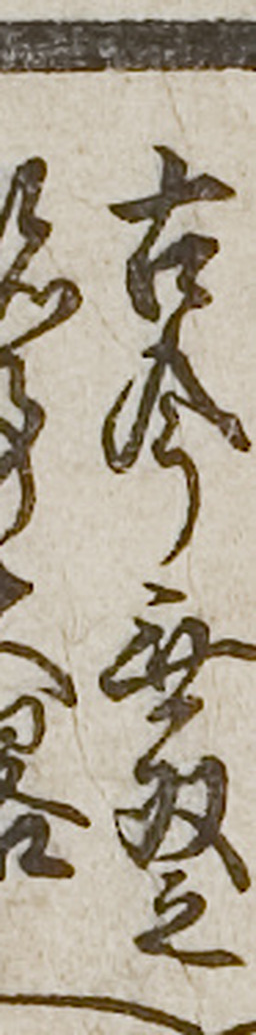現事大略
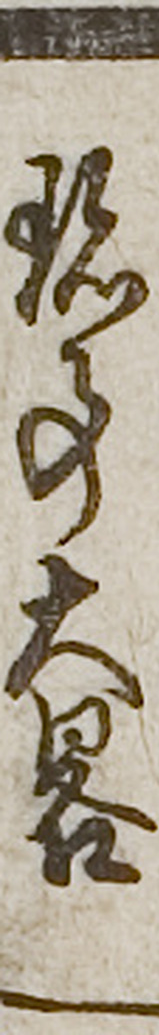現事大略
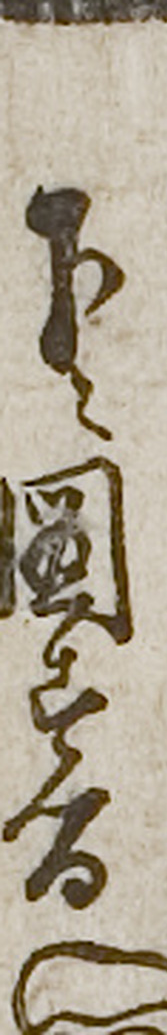下に図する
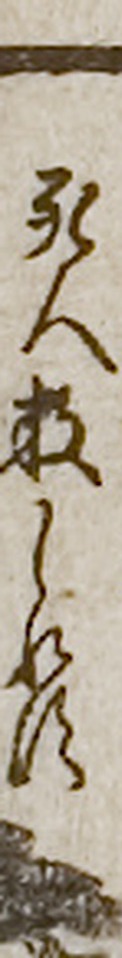死人数しれつ
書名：江戸東海道東国荒珍事図
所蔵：東京大学総合図書館 General Library in the University of Tokyo, JAPAN
